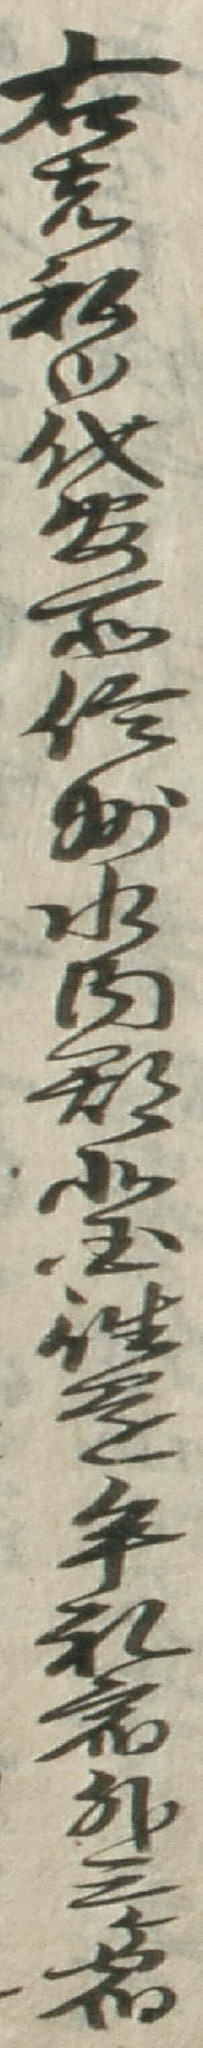右は私御代官所信州水内郡北国往還牟礼宿外三ヶ宿
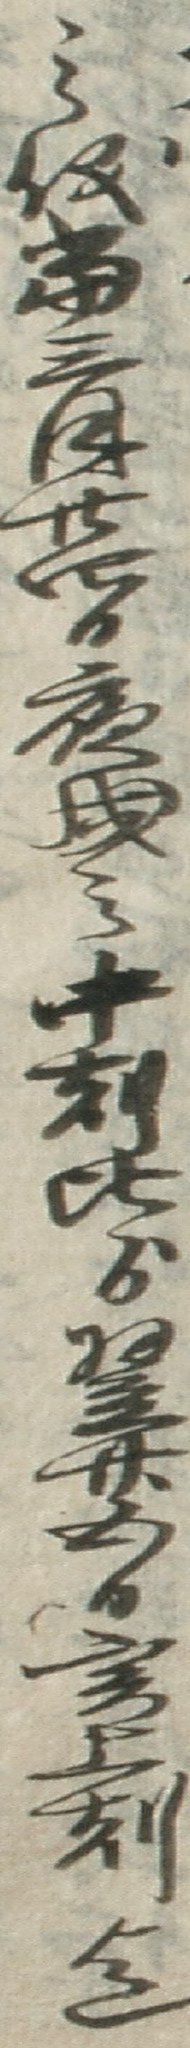之儀当三月廿四日夜戌之中刻比ゟ翌廿五日亥上刻迄
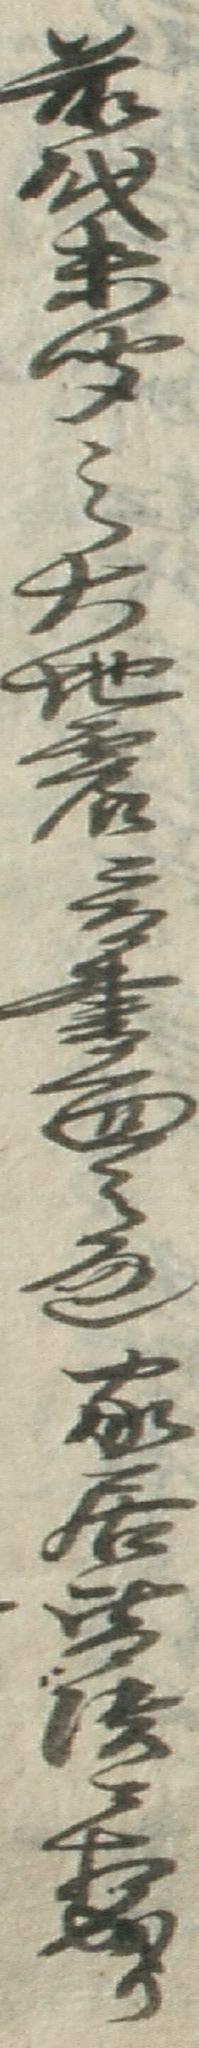前代未聞之大地震二而書面之通家居皆潰二相成り
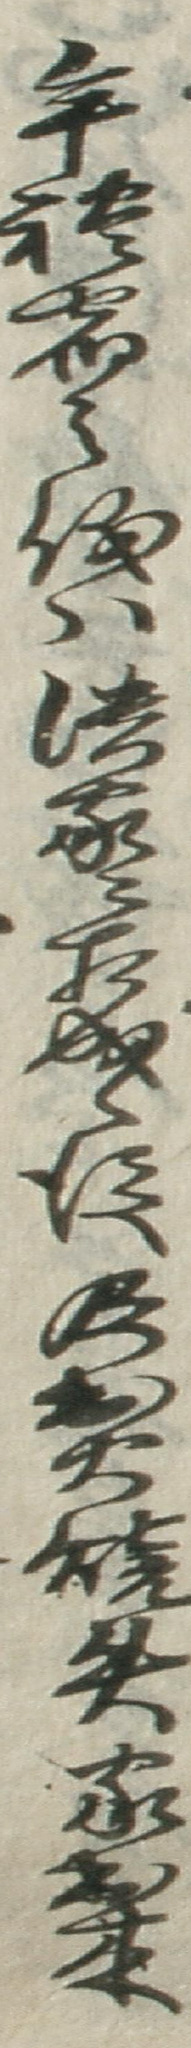牟礼宿之儀ハ潰家二相成候後及出火焼失家出来
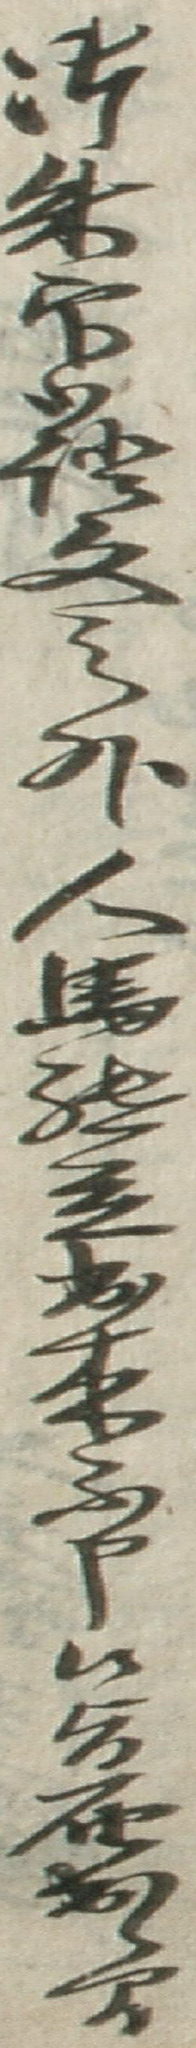御朱印御證文之外人馬継立出来不申候旨届出候間
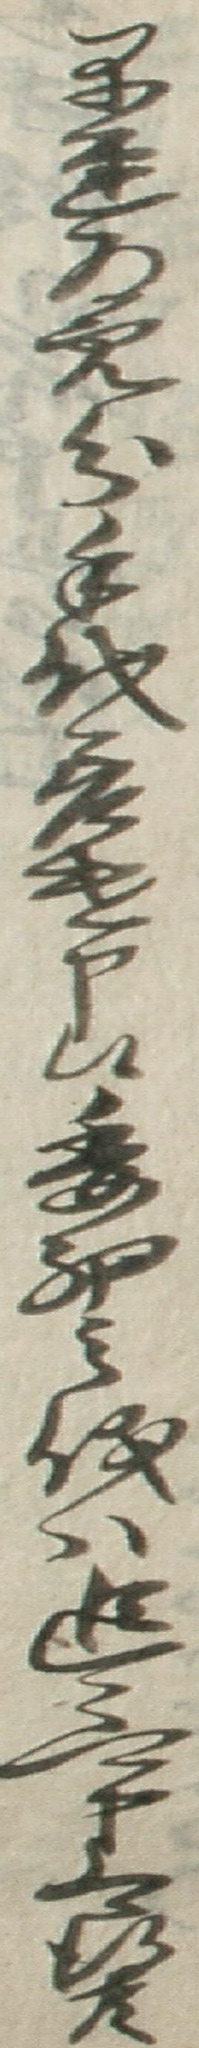早速為見分手代差遣申候委細之儀ハ追々可申上候得共

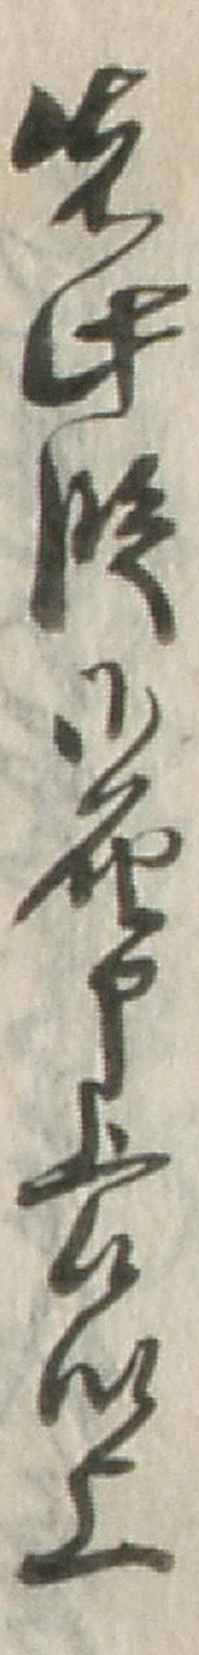先此段御届申上置候以上
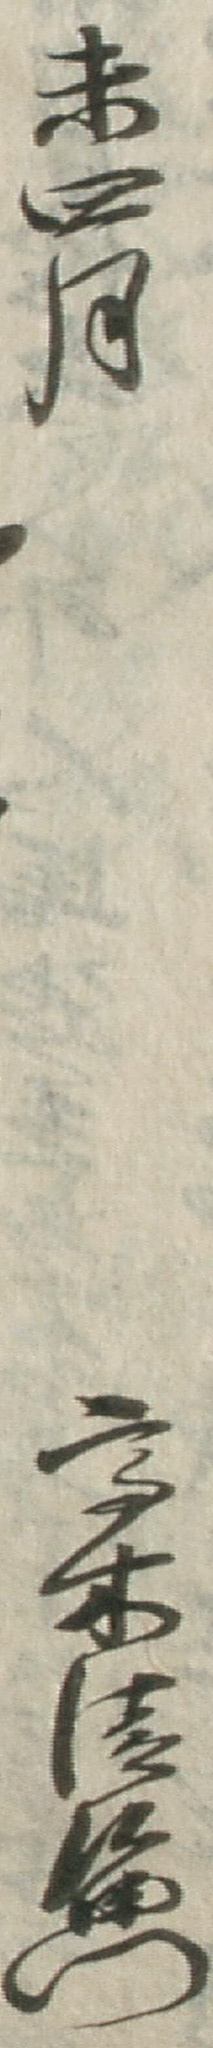未四月高木清左衛門
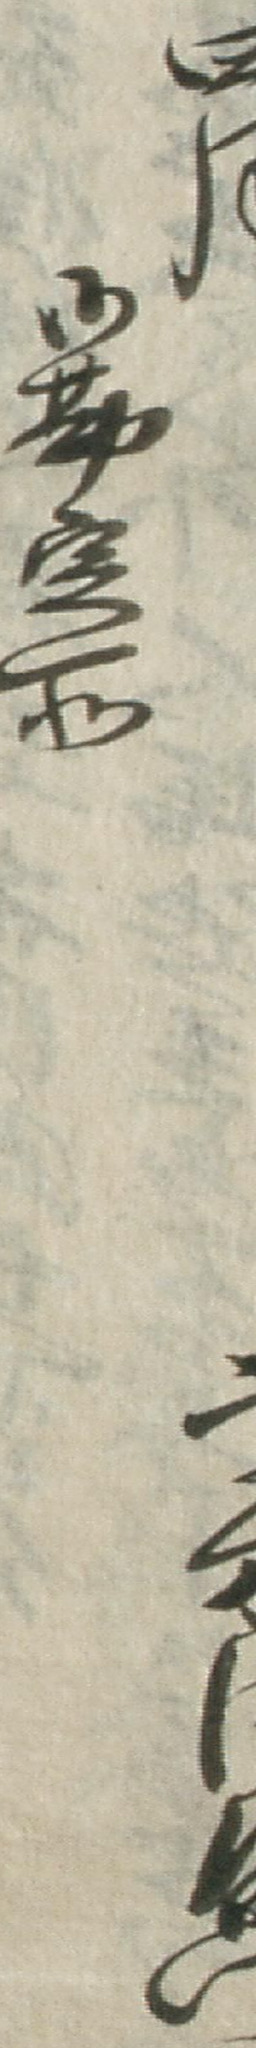御勘定所
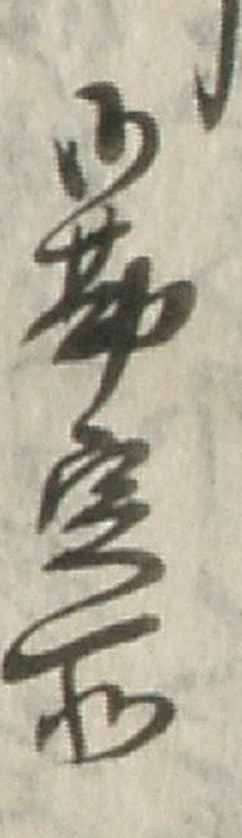御勘定所
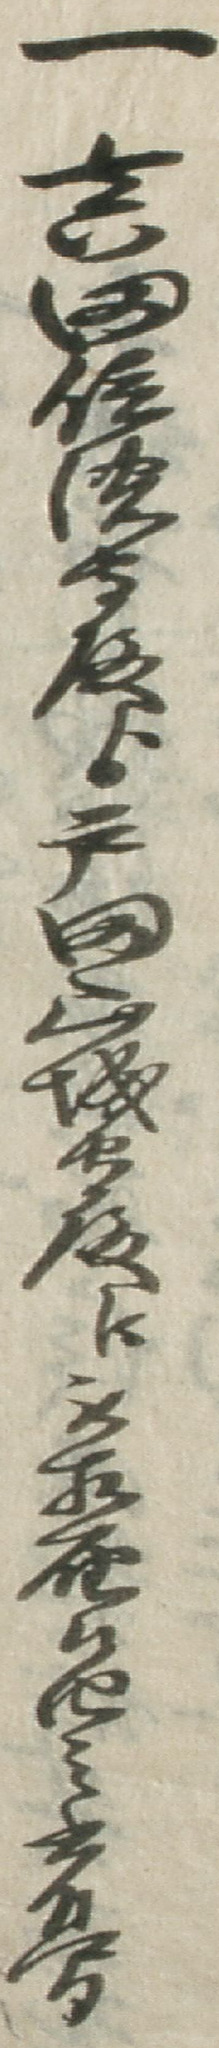一真田信濃守殿ゟ戸田山城守殿江被相届候由之書付写
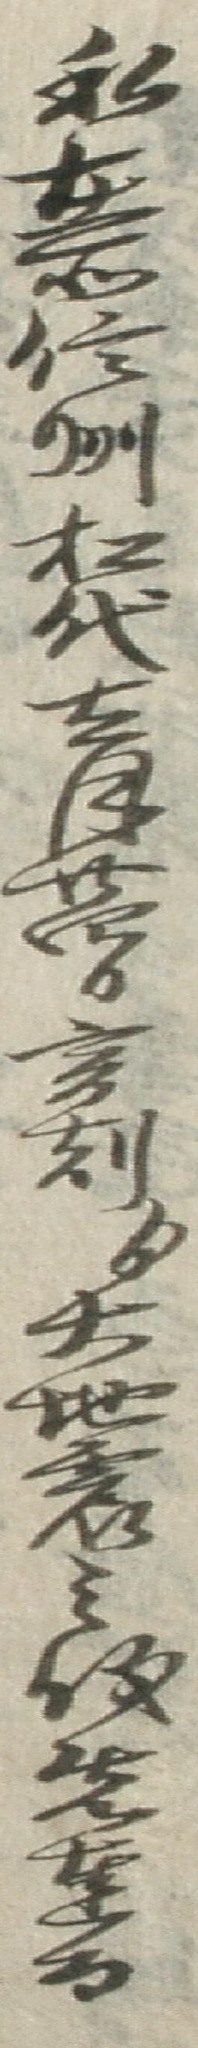私在所信州松代去月廿四日亥刻ゟ大地震之儀先達而
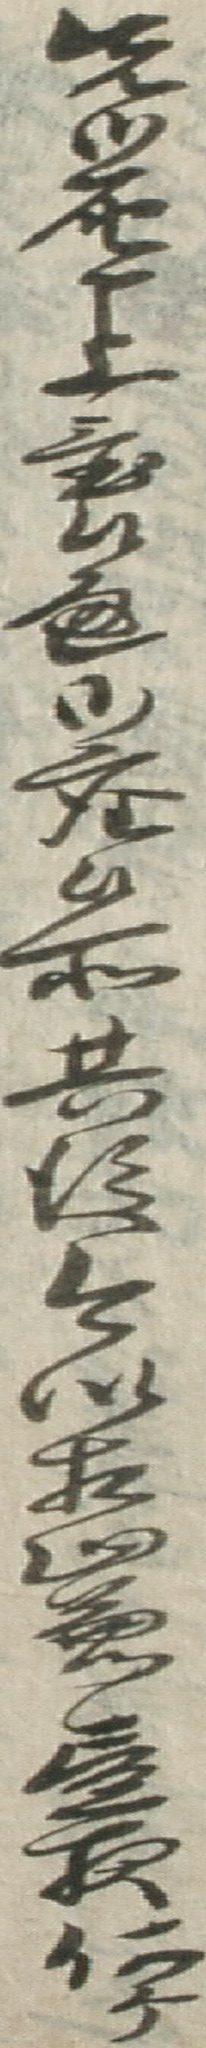先御届申上置候通御座候所其後今以相止兼昼夜何ヶ
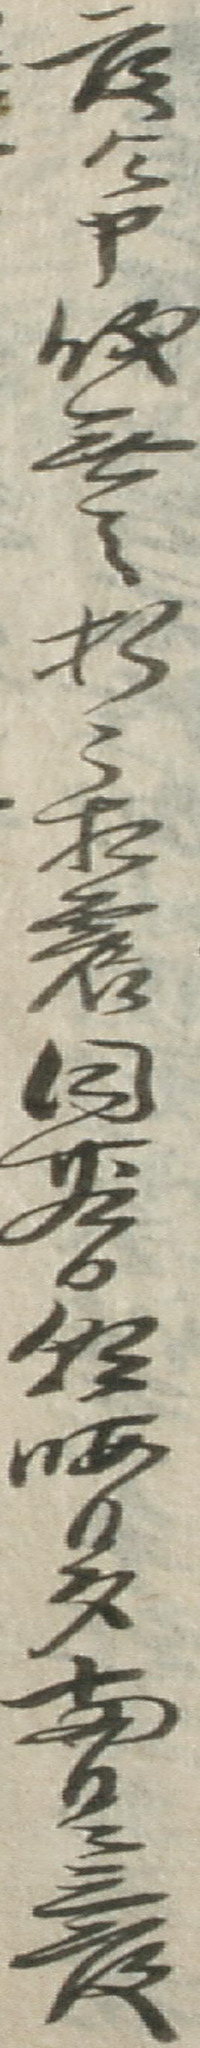度と申儀無之折々相震同廿九日朝晦日夕両日ニ三度
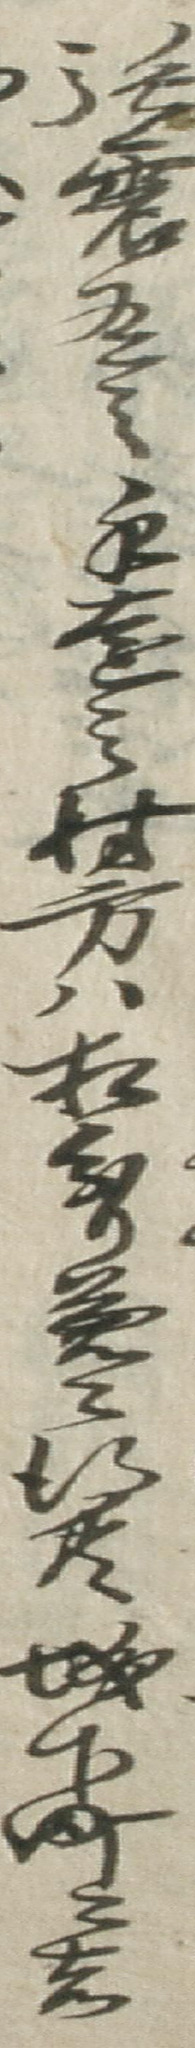強震有之手遠之村方ハ相分兼候得共城下町二は
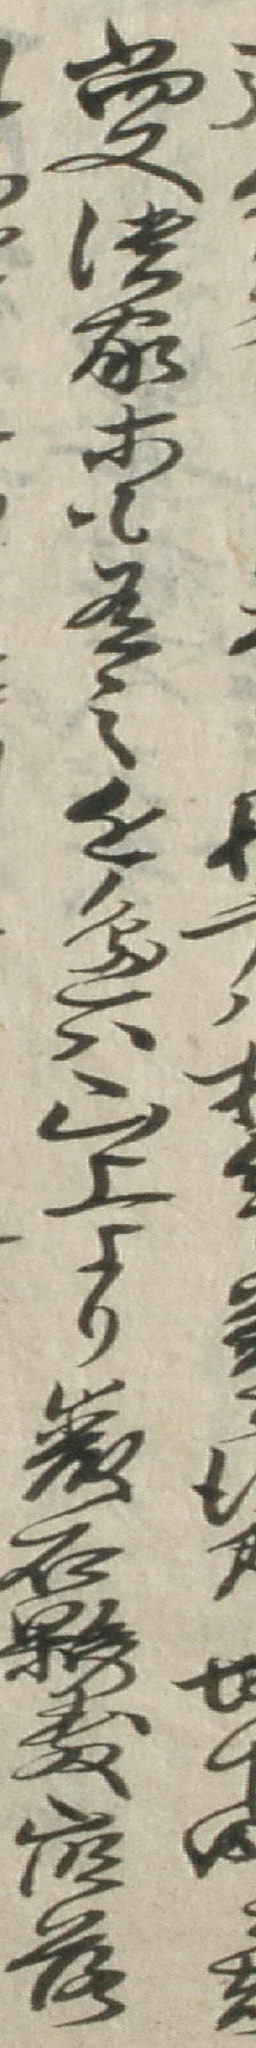尚又潰家等も有之近辺ハ山上より巌石夥敷崩落
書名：信濃國地震實録記
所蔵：東京大学地震研究所図書室 Earthquake Research Institute Library, The University of Tokyo, JAPAN
